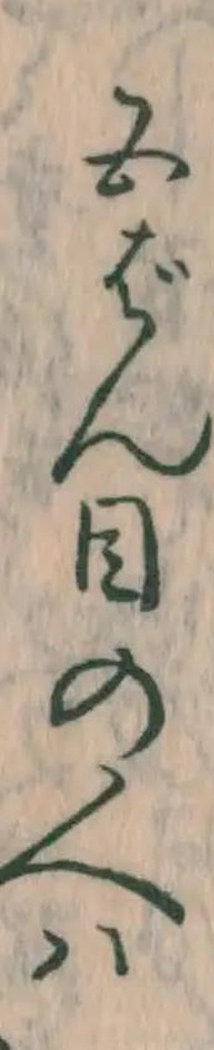五ばん目の人は
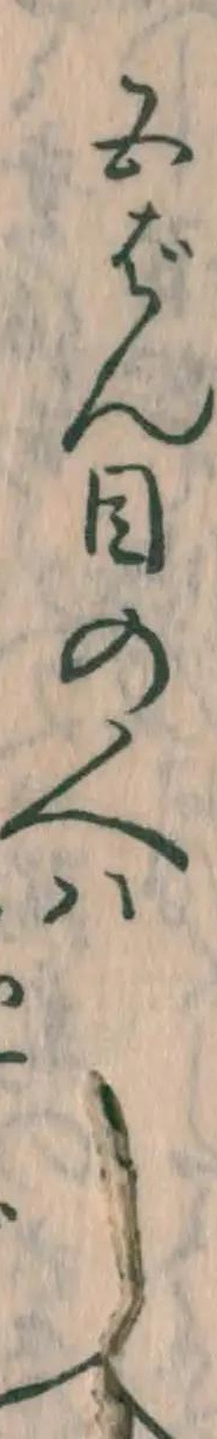五ばん目の人は
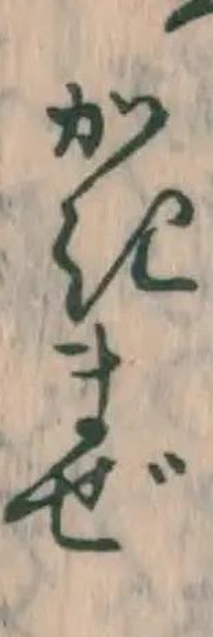かきまぜ
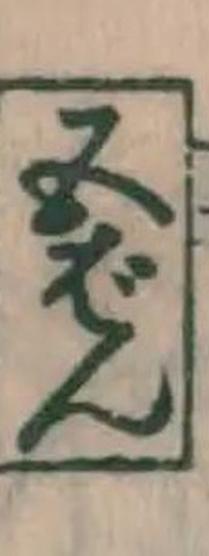五ばん
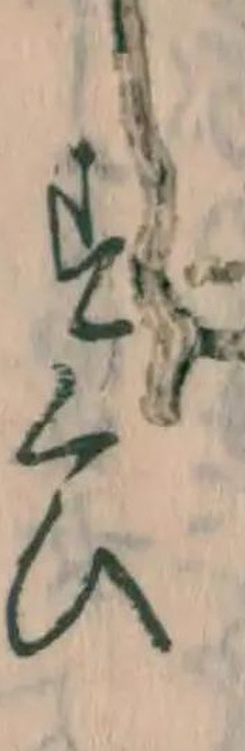すくひ
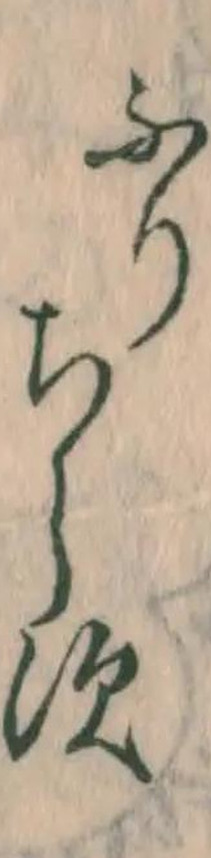ちらす
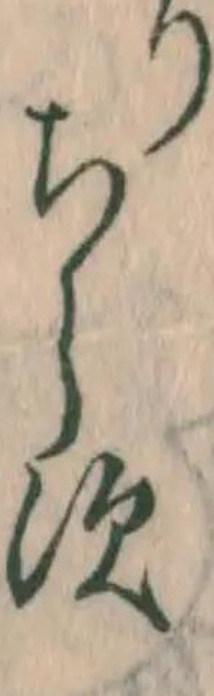ちらす
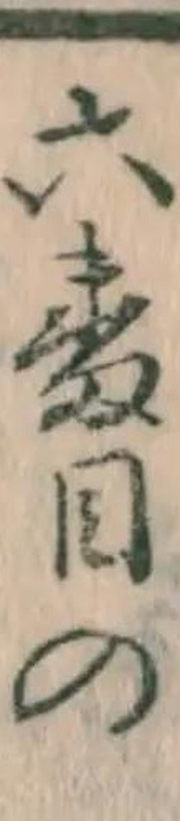六番目の
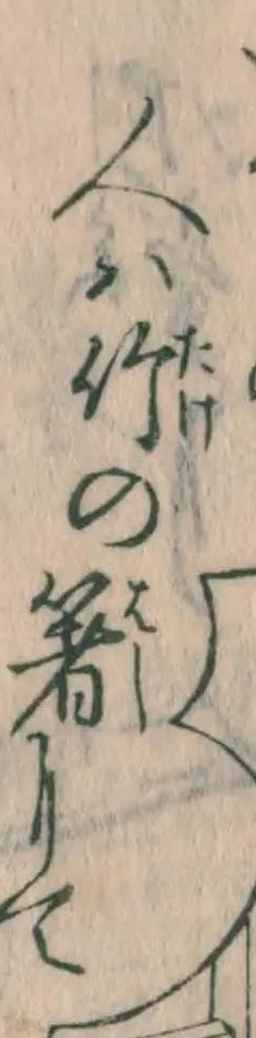人は竹の箸にて
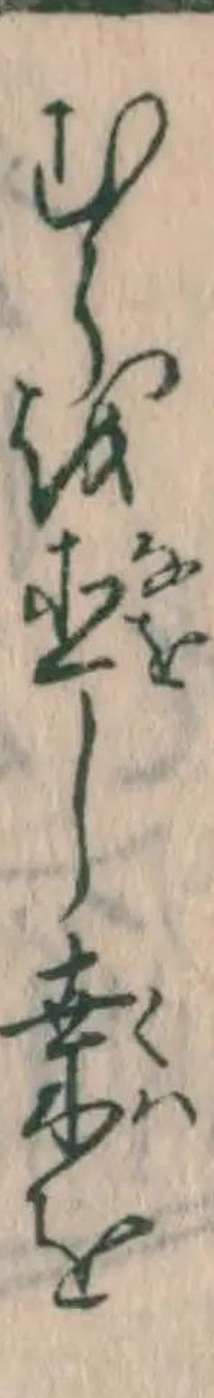むらを直し桑を
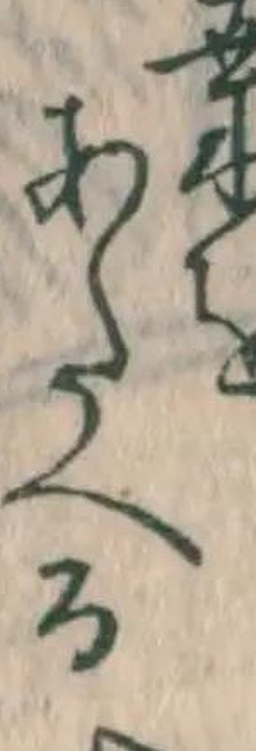あたへる
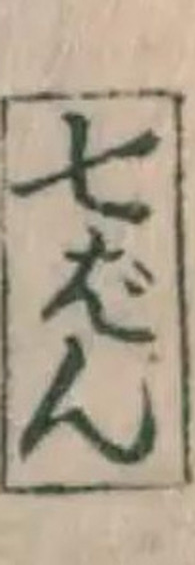七ばん
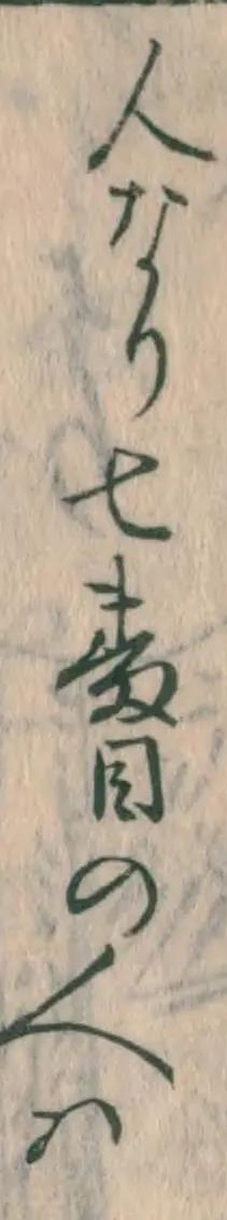人なり七番目の人は
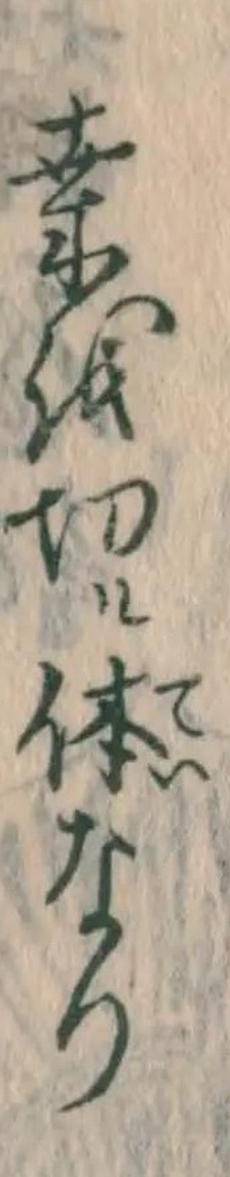桑を切体なり
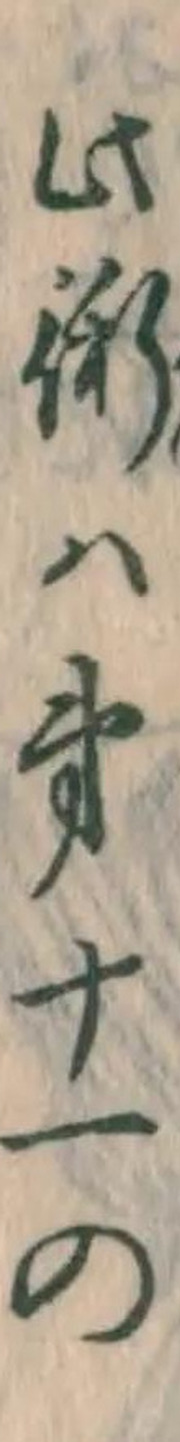此術は第十一の
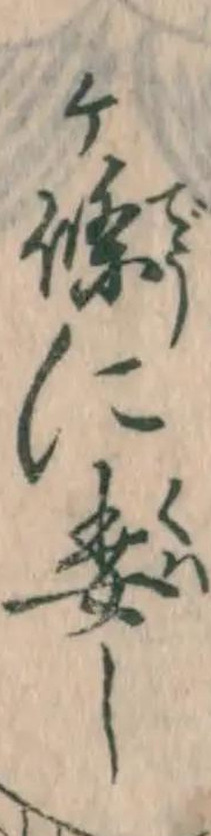ヶ条に委し
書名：新撰養蚕秘書
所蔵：国立国会図書館 National Diet Library, JAPAN
